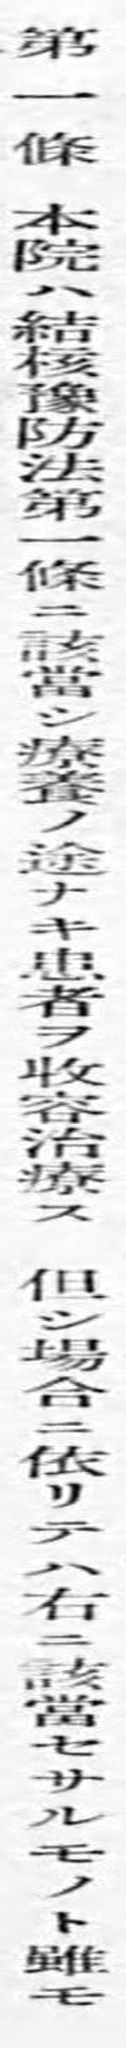第一条本院ハ結核予防法第一条ニ該当シ療養ノ途ナキ患者ヲ収容治療ス但シ場合ニ依リテハ右ニ該当セサルモノト雖モ
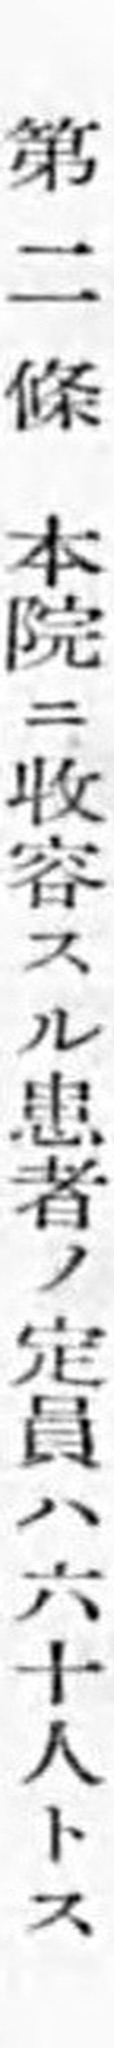第二条本院ニ収容スル患者ノ定員ハ六十人トス
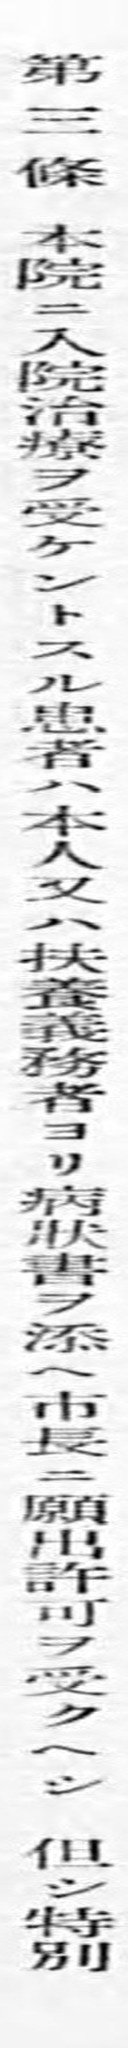第三条本院ニ入院治療ヲ受ケントスル患者ハ本人又ハ扶養義務者ヨリ病状書ヲ添ヘ市長ニ願出許可ヲ受クヘシ但シ特別
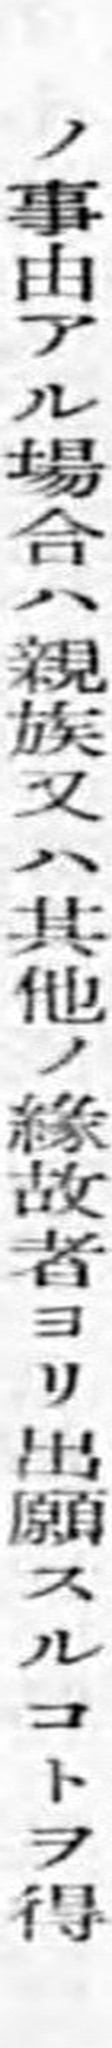ノ事由アル場合ハ親族又ハ其他ノ縁故者ヨリ出願スルコトヲ得
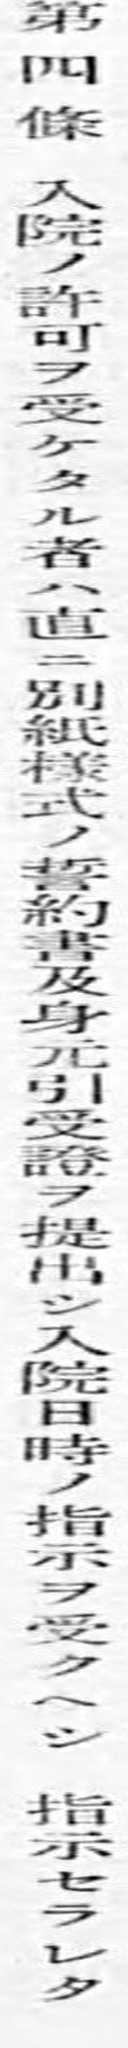第四条入院ノ許可ヲ受ケタル者ハ直ニ別紙様式ノ誓約書及身元引受証ヲ提出シ入院日時ノ指示ヲ受クヘシ指示セラレタ
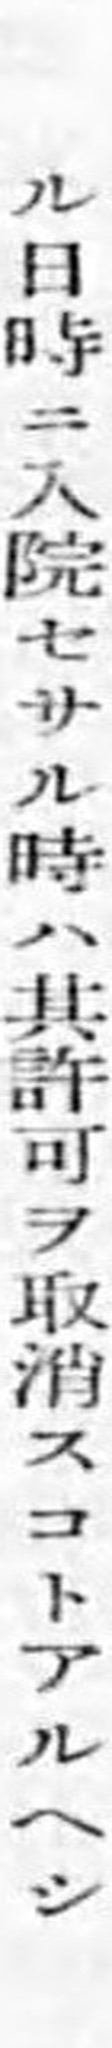ル日時ニ入院セサル時ハ其許可ヲ取消スコトアルヘシ

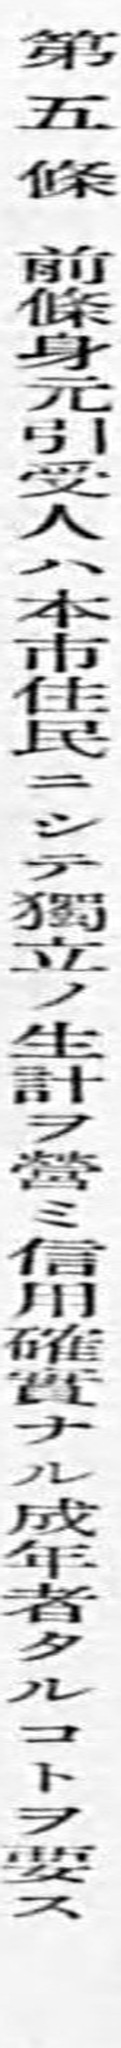第五条前条身元引受人ハ本市住民ニシテ独立ノ生計ヲ営ミ信用確実ナル成年者タルコトヲ要ス
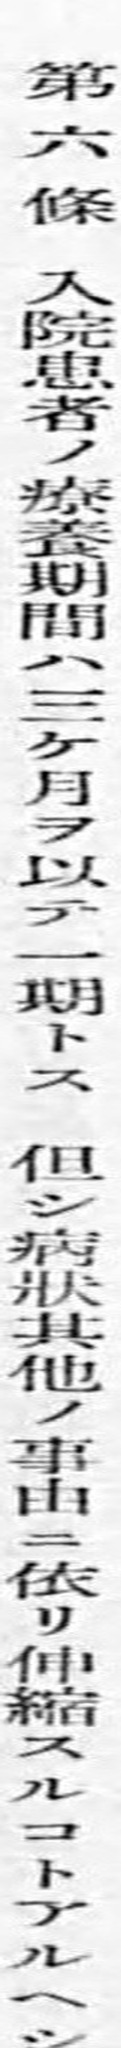第六条入院患者ノ療養期間ハ三ヶ月ヲ以テ一期トス但シ病状其他ノ事由ニ依リ伸縮スルコトアルヘシ
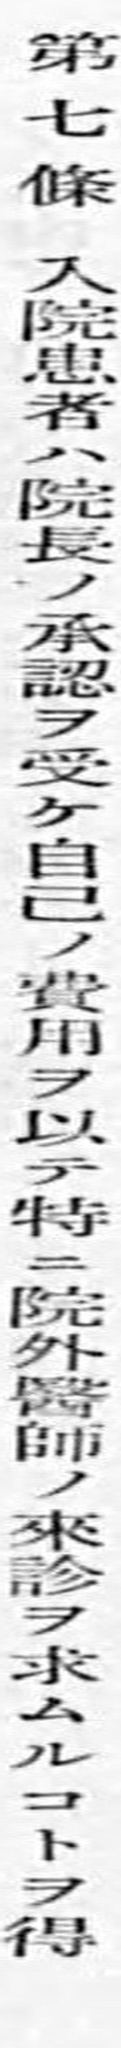第七条入院患者ハ院長ノ承認ヲ受ケ自己ノ費用ヲ以テ特ニ院外医師ノ来診ヲ求ムルコトヲ得
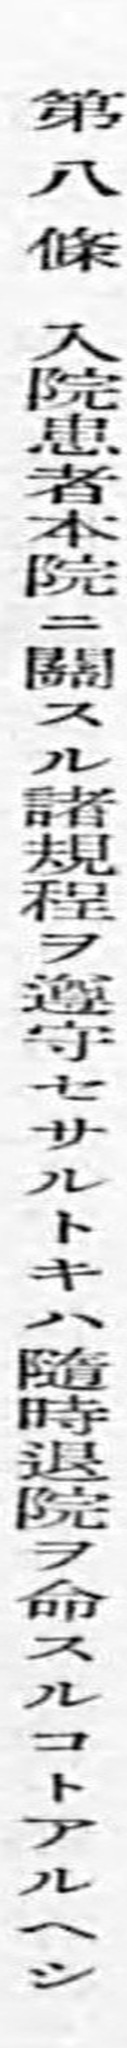第八条入院患者本院ニ関スル諸規程ヲ遵守セサルトキハ随時退院ヲ命スルコトアルヘシ
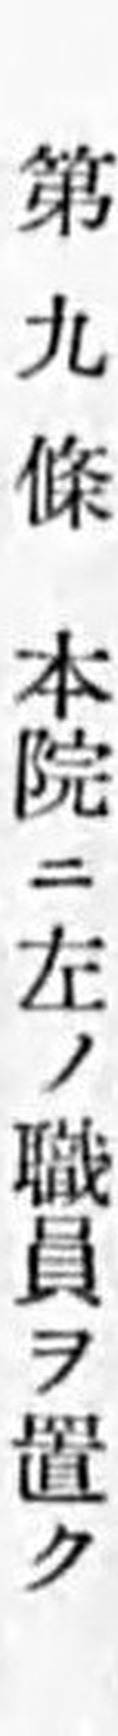第九条本院ニ左ノ職員ヲ置ク
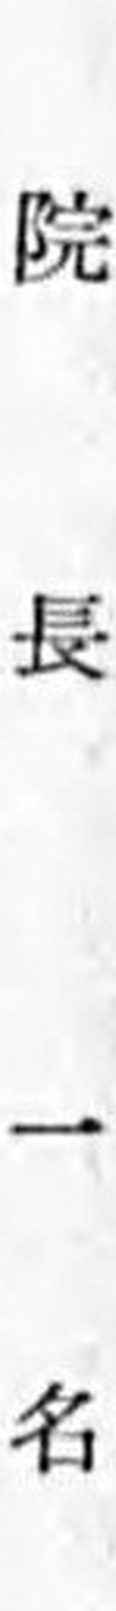院長一名
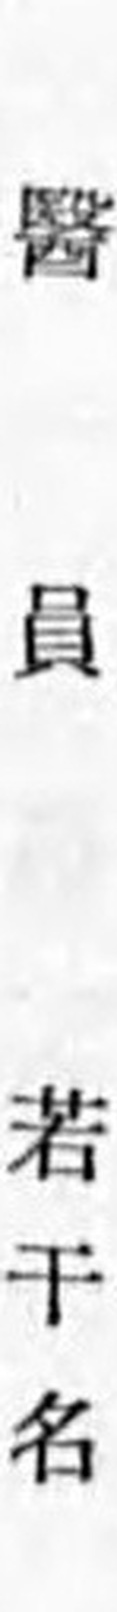医員若干名
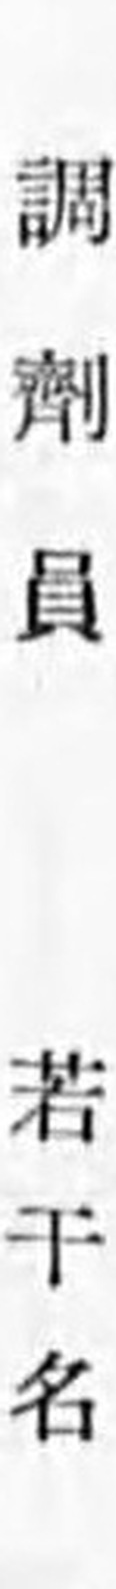調剤員若干名
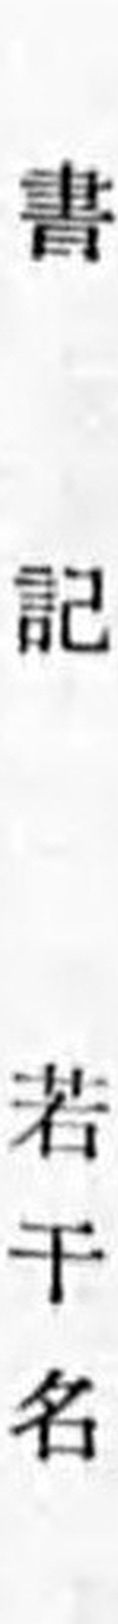書記若干名
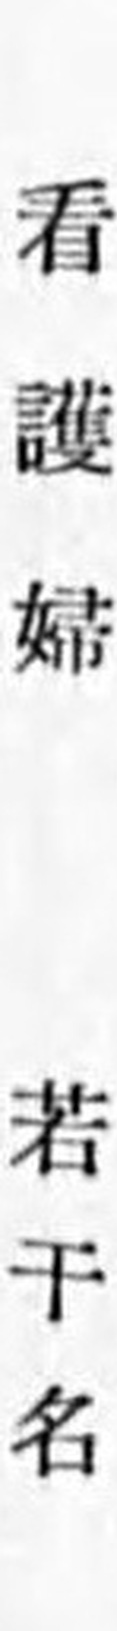看護婦若干名
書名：豊橋市立高山病院年報. 昭和12年度
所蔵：国立国会図書館 National Diet Library, JAPAN
